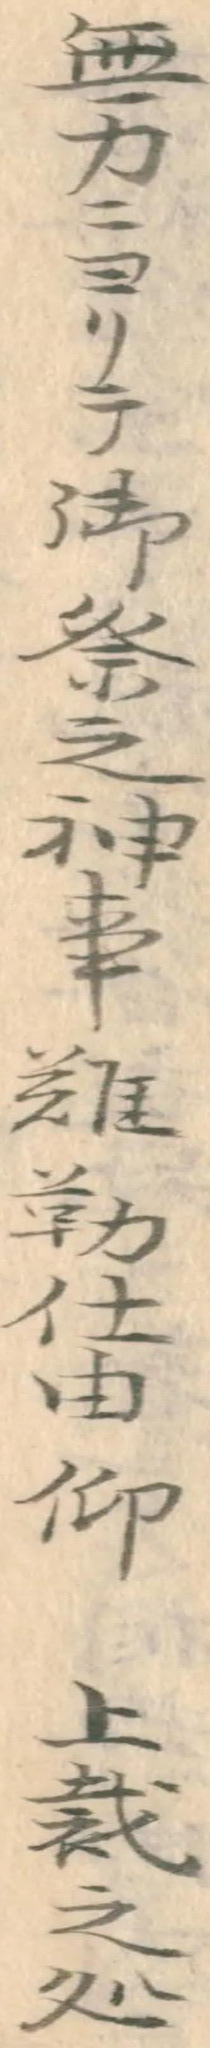無力ニヨリテ御祭之神事難勤仕由仰上裁之処
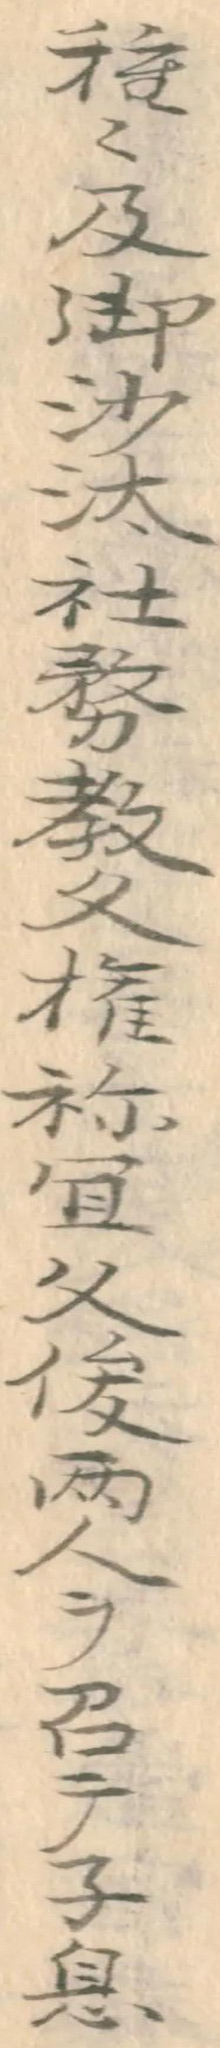種々及御沙汰社務教久権祢宜久俊両人ヲ召テ子息
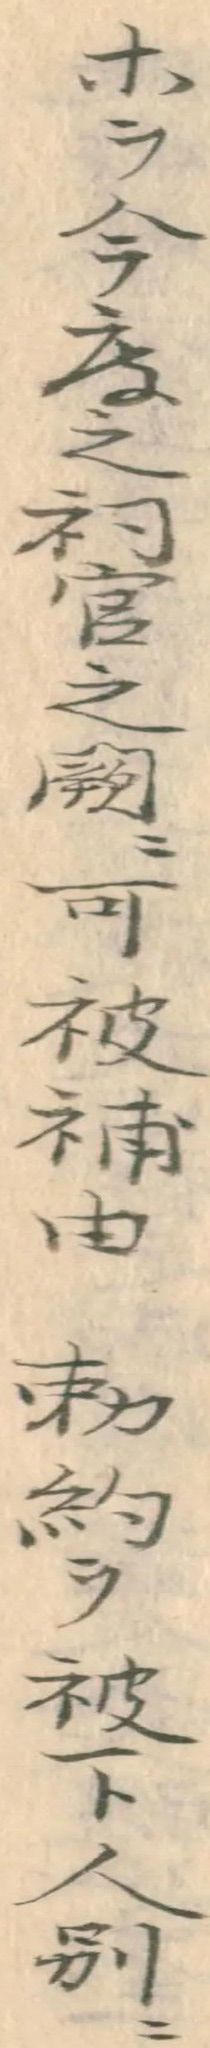等ヲ今度之祠官之闕ニ可被補由勅約ヲ被下人別ニ
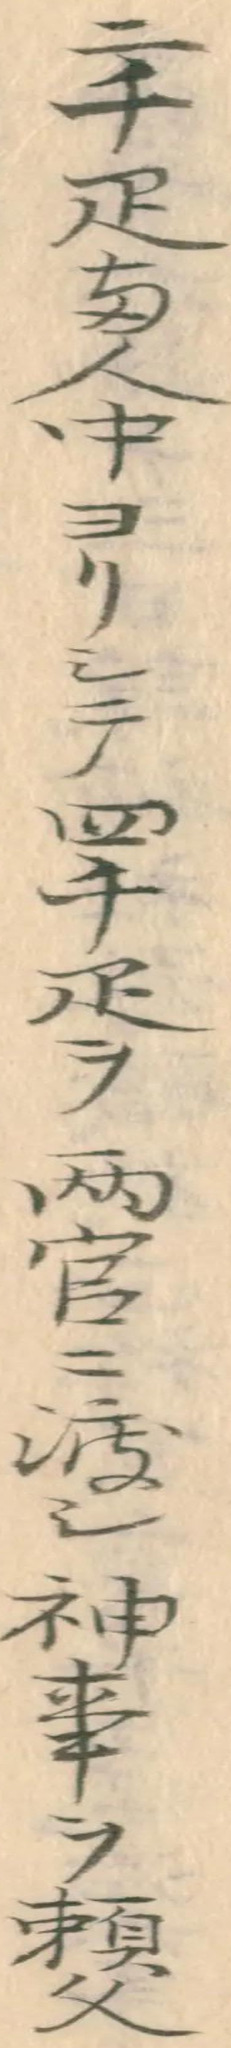二千疋両人中ヨリシテ四千疋ヲ両官ニ渡シ神事ヲ頼久
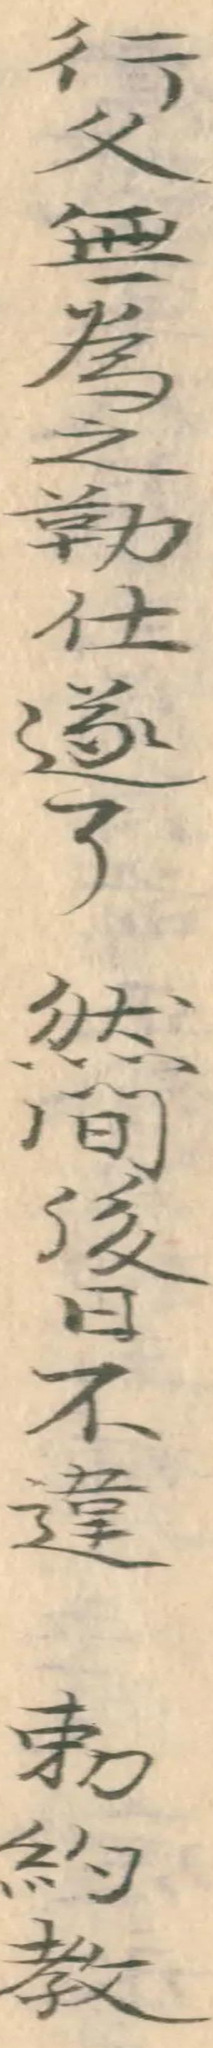行久無為之勤仕遂了然間後日不違勅約教
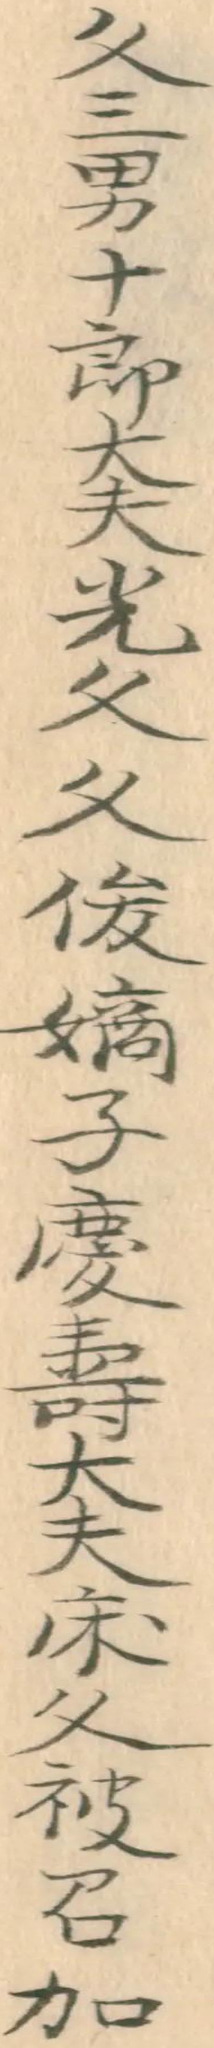久三男十郎大夫光久久俊嫡子慶寿大夫床久被召加

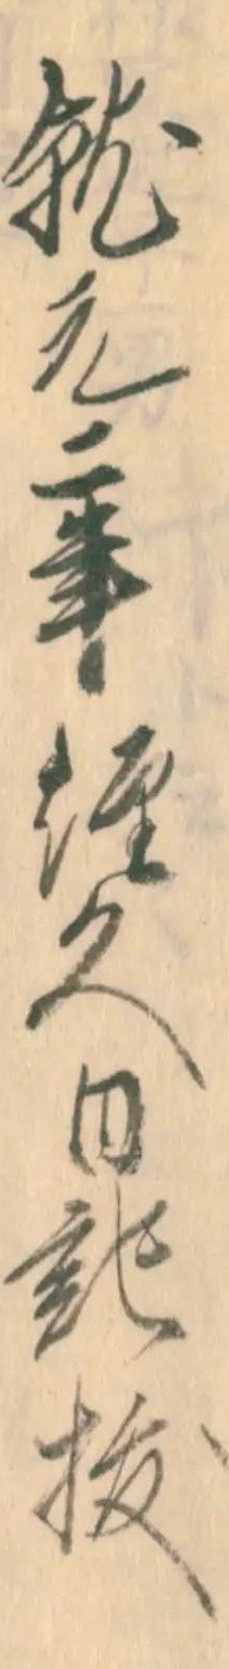就元二年経久日記抜
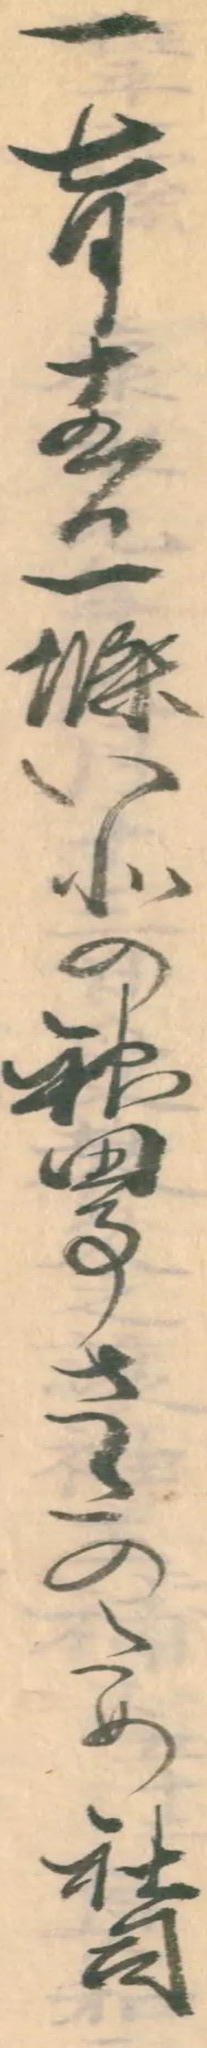一七月十九日一条い北の神田事さたのため社司
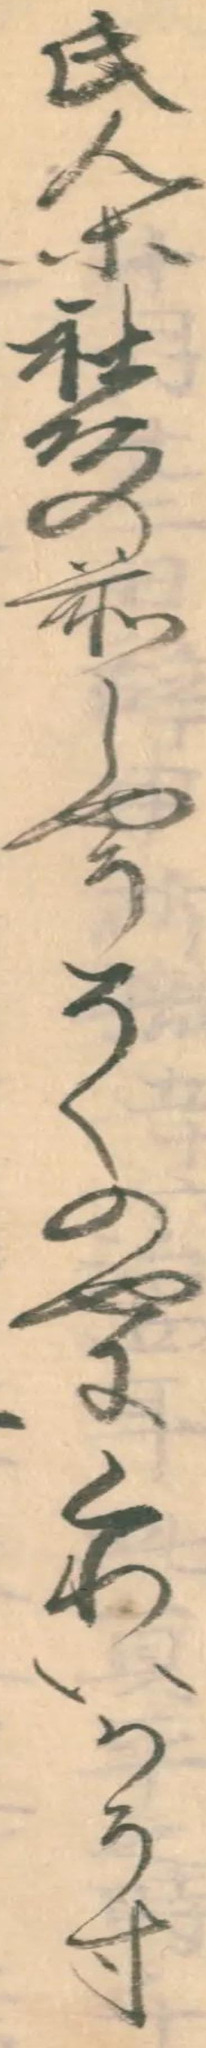氏人等社頭の前しやうそくのやにくわいかうす
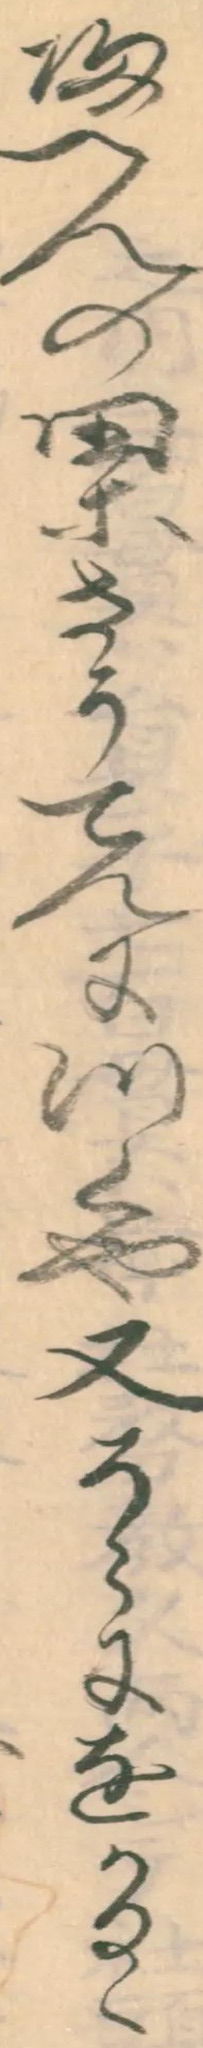帰へんの田等さうてんにつくや又そらにをかるゝ
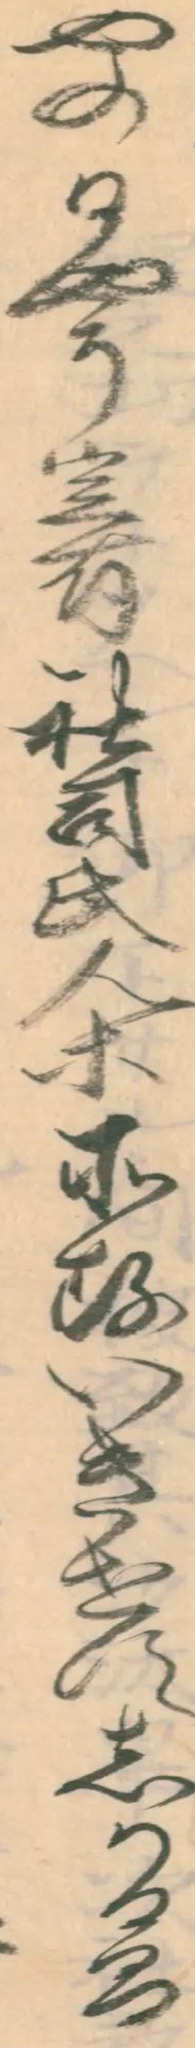やの日やう定有り社司氏人等所存いき遣すしかる間
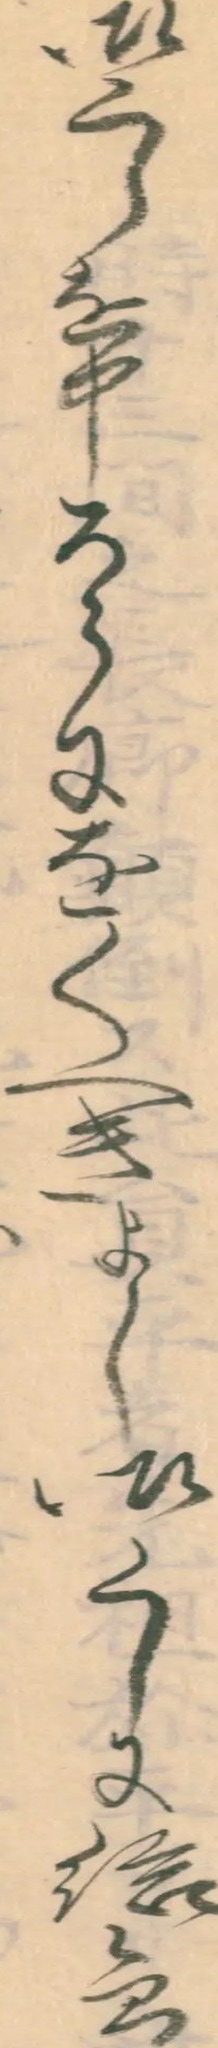御くしを中ろうにをくへきよし御くしに給候間
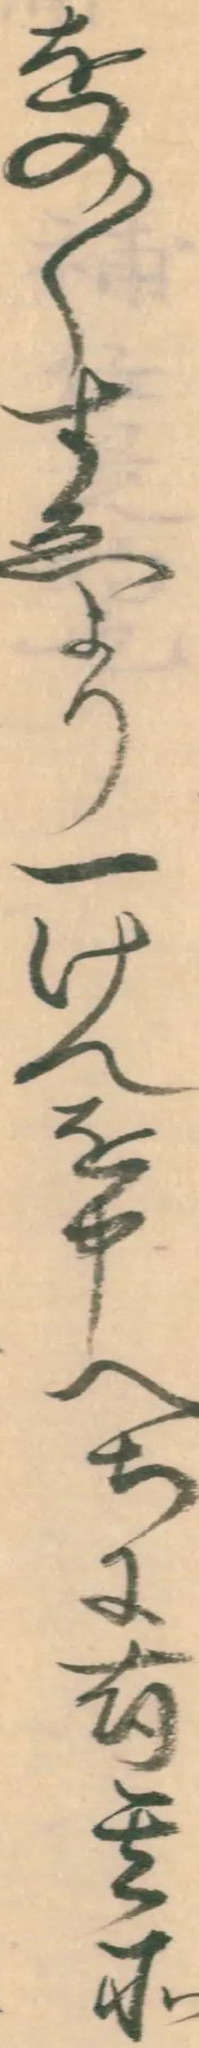をの〳〵すゑより一けんを申へちに有其所
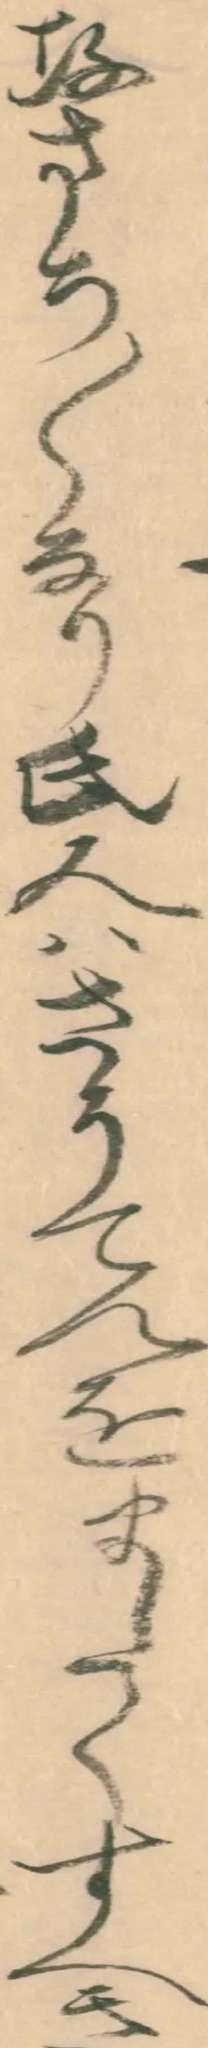存さう〳〵なり氏人はさうてんをまたくすへき
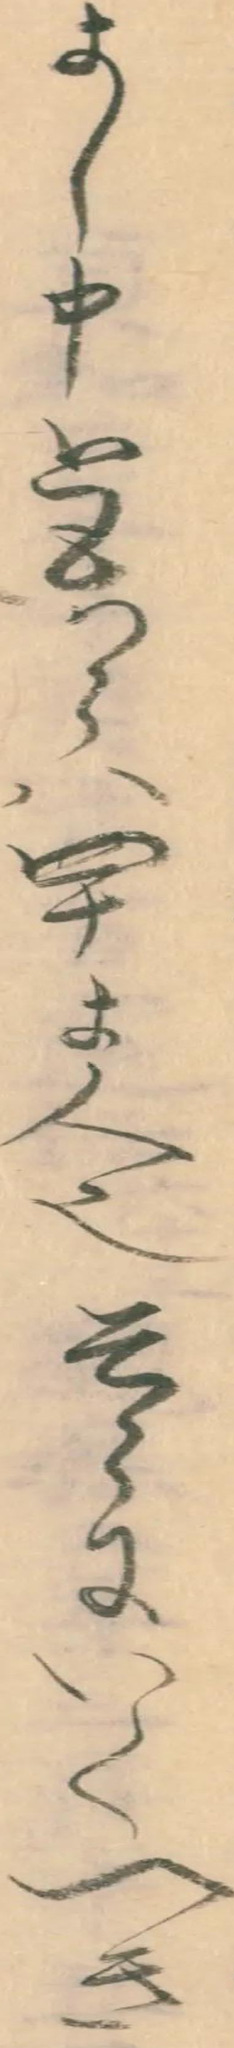よし申ともからは四十よ人也そらにいくへき
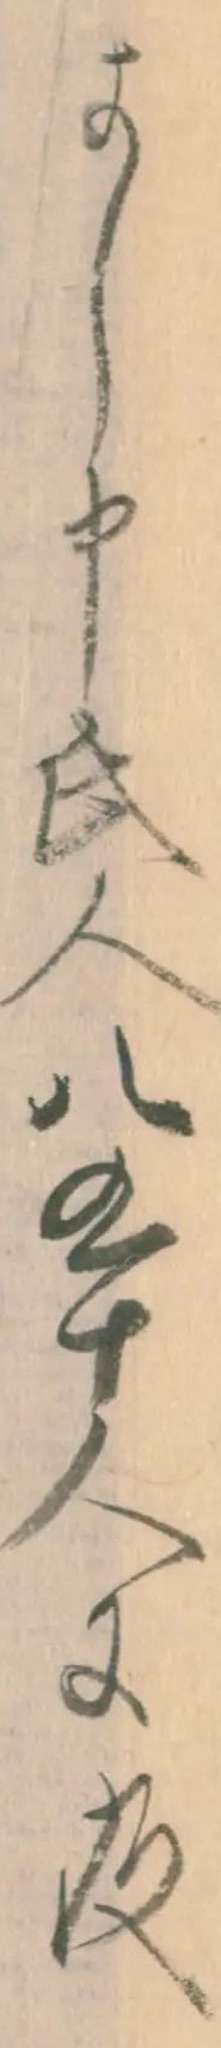よし申氏人八九十人に及
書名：賀茂社記録. 第24冊
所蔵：国立国会図書館 National Diet Library, JAPAN
